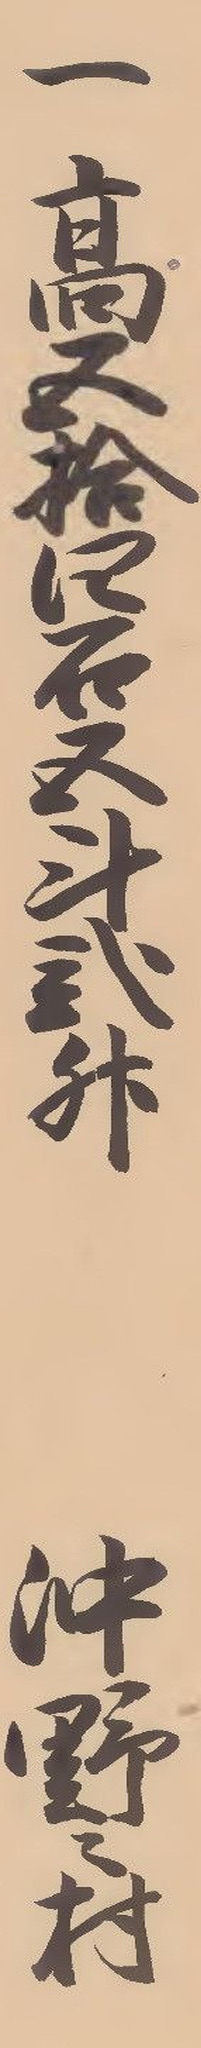一髙五拾四石五斗弐升沖野々村
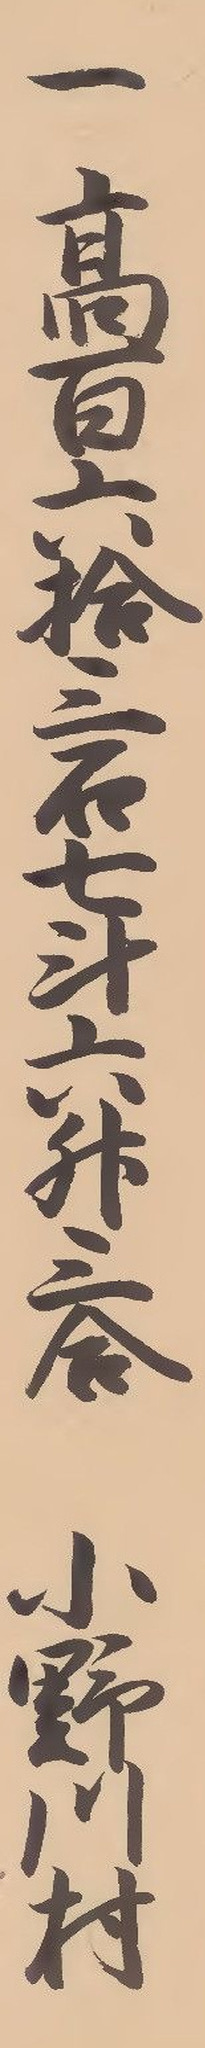一髙百六拾三石七斗六升三合小野川村
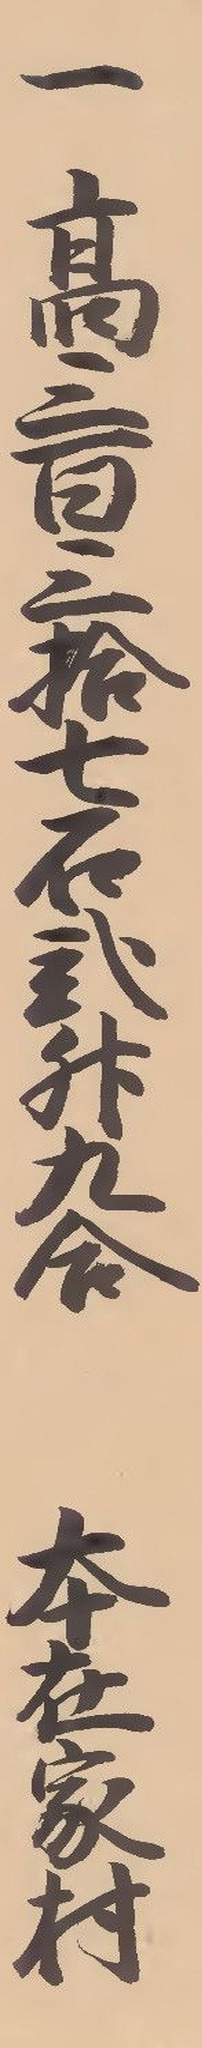一髙三百三拾七石弐升九合本在家村
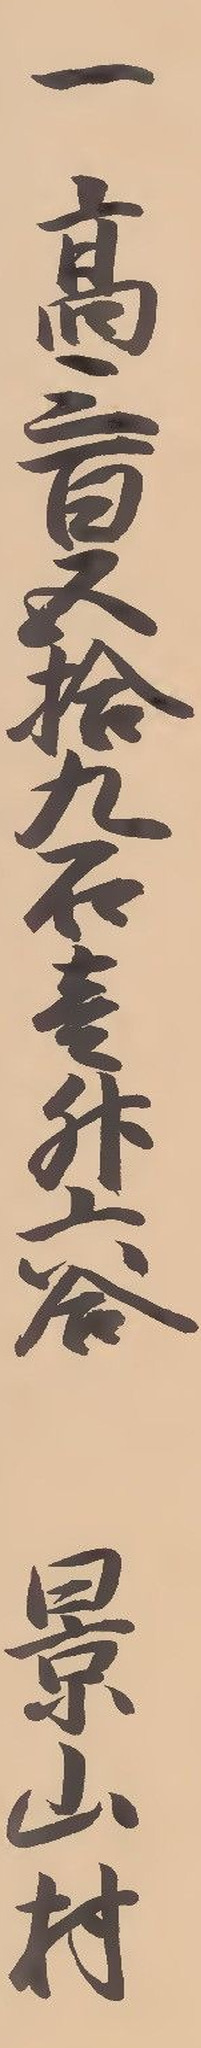一髙三百五拾九石壱升六合景山村
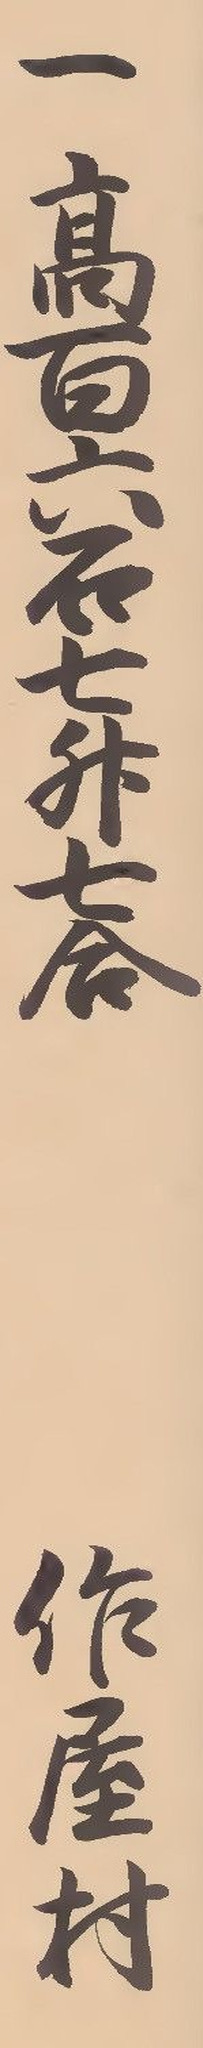一髙百六石七升七合作屋村
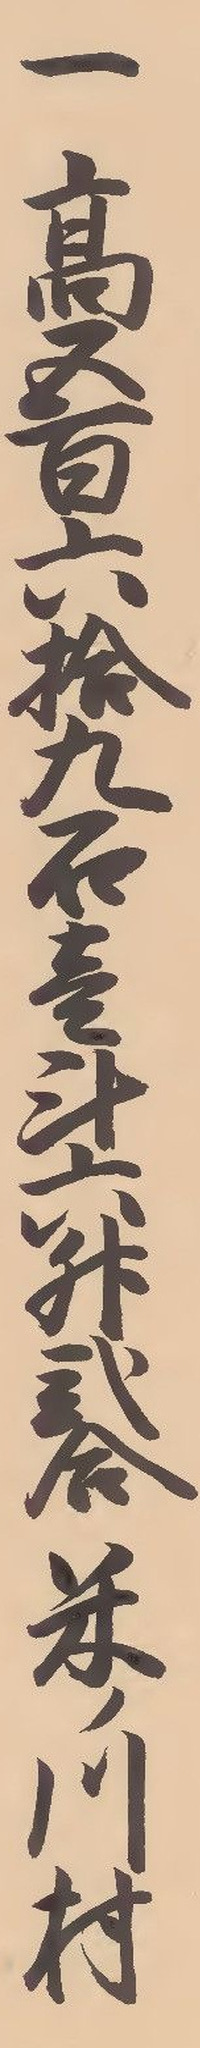一髙五百六拾九石壱斗六升弐合米ノ川村
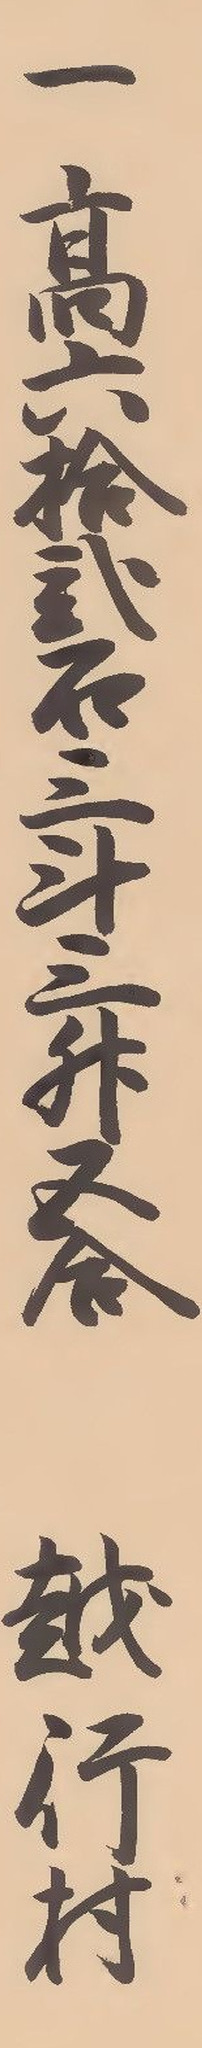一髙六拾弐石三斗三升五合越行村
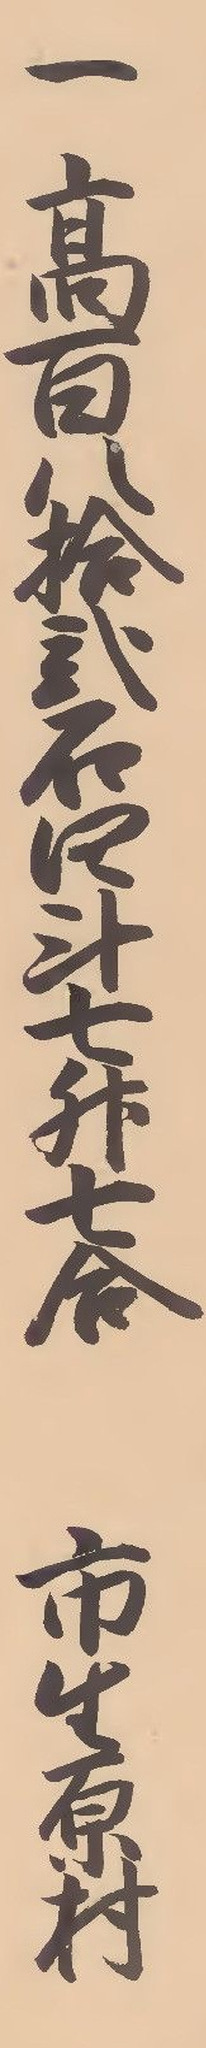一髙百八拾弐石四斗七升七合市生原村

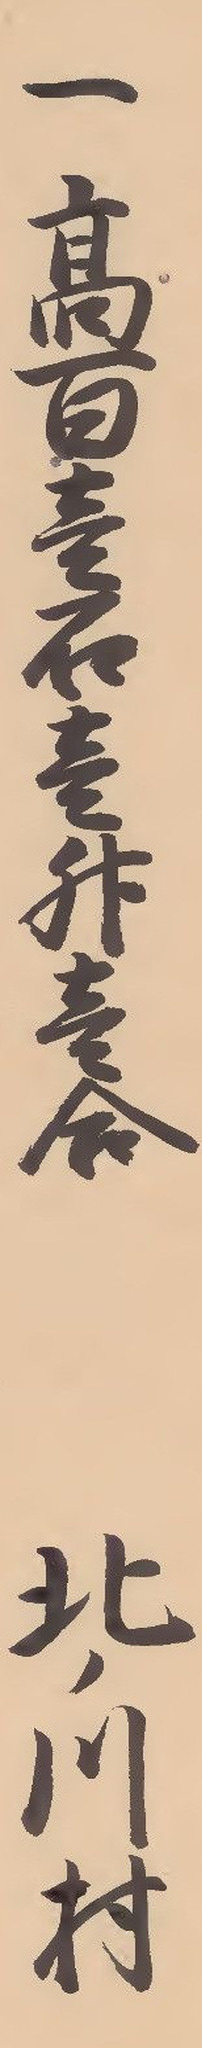一髙百壱石壱升壱合北ノ川村
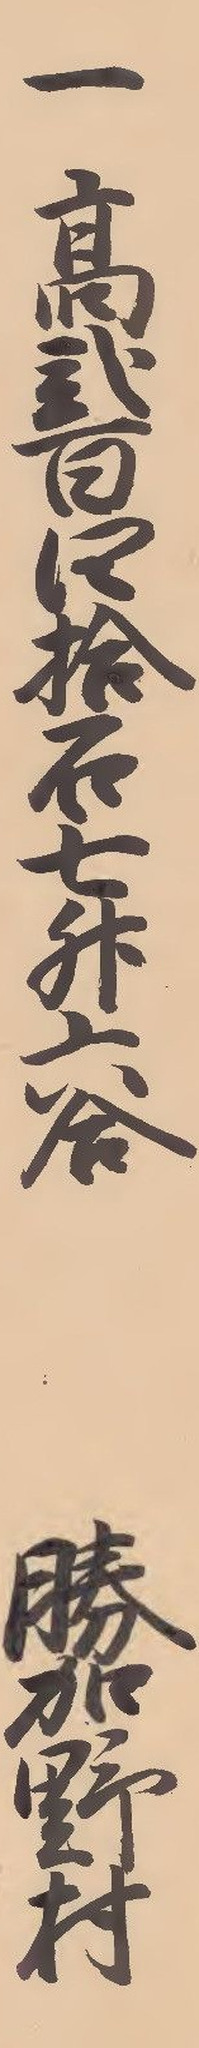一髙弐百四拾石七升六合勝加野村
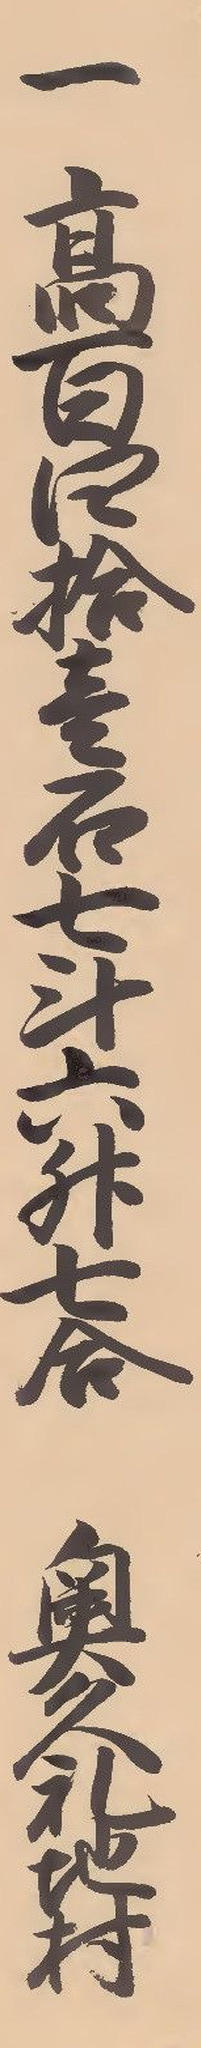一髙百四拾壱石七斗六升七合奥久礼地村
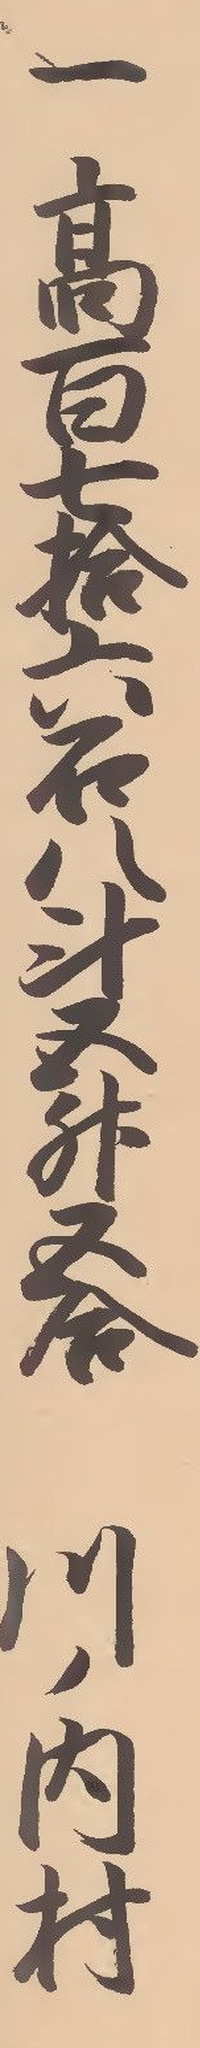一髙百七拾六石八斗五升五合川ノ内村
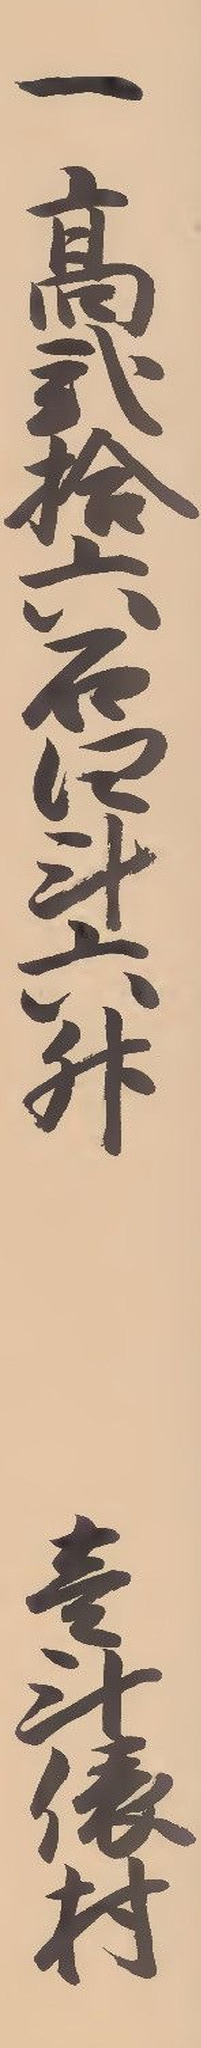一髙弐拾六石四斗六升壱斗俵村
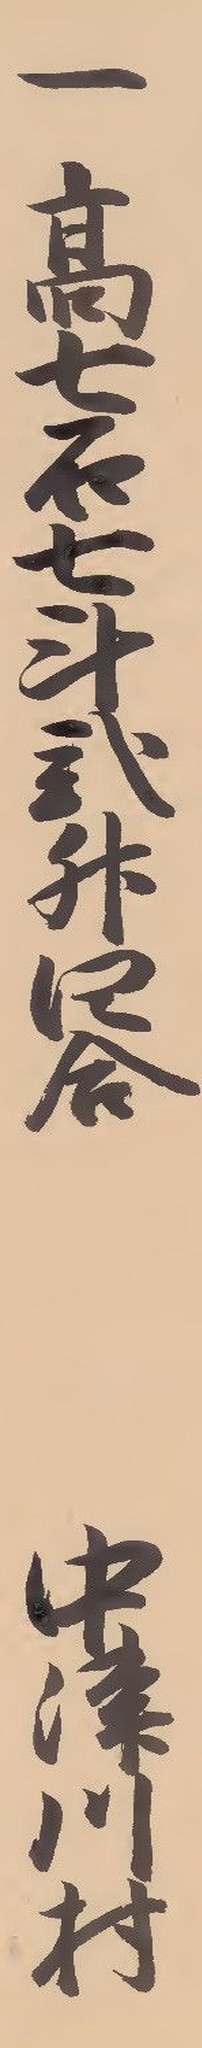一髙七石七斗弐升四合中津川村
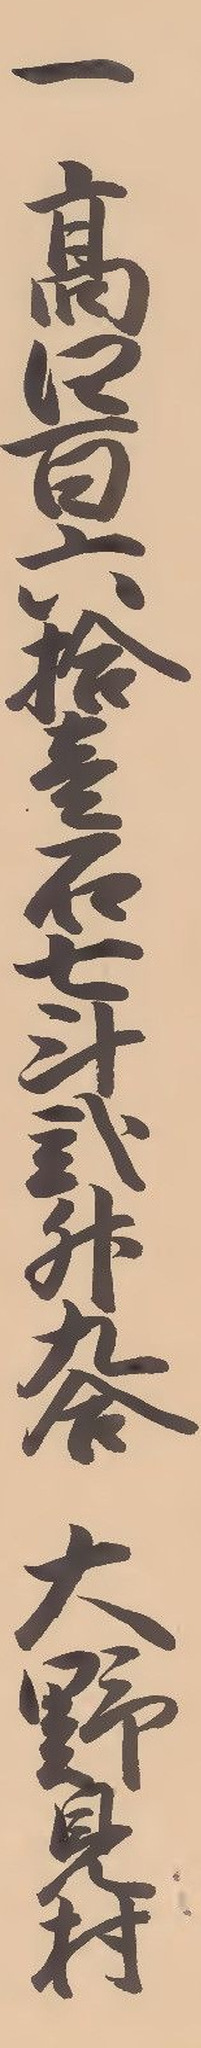一髙四百六拾壱石七斗弐升九合大野見村
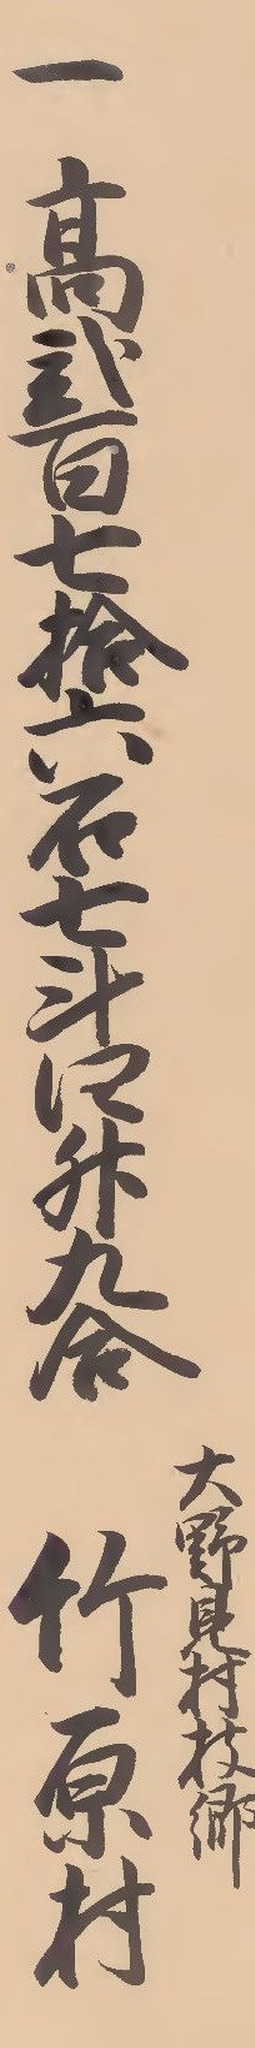一髙弐百七拾六石七斗四升九合竹原村
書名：土佐国郷帳
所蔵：国立公文書館 National Archives of Japan
